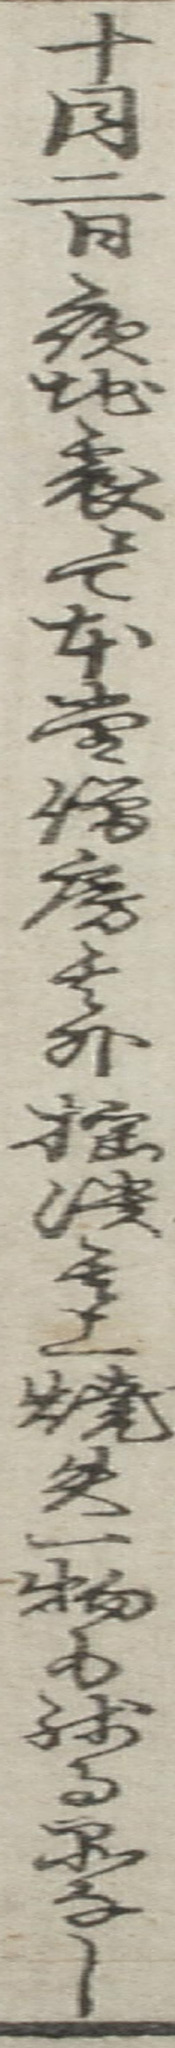十月二日夜地震にて本堂僧房其外揺潰其上焼失一物も残る品なし
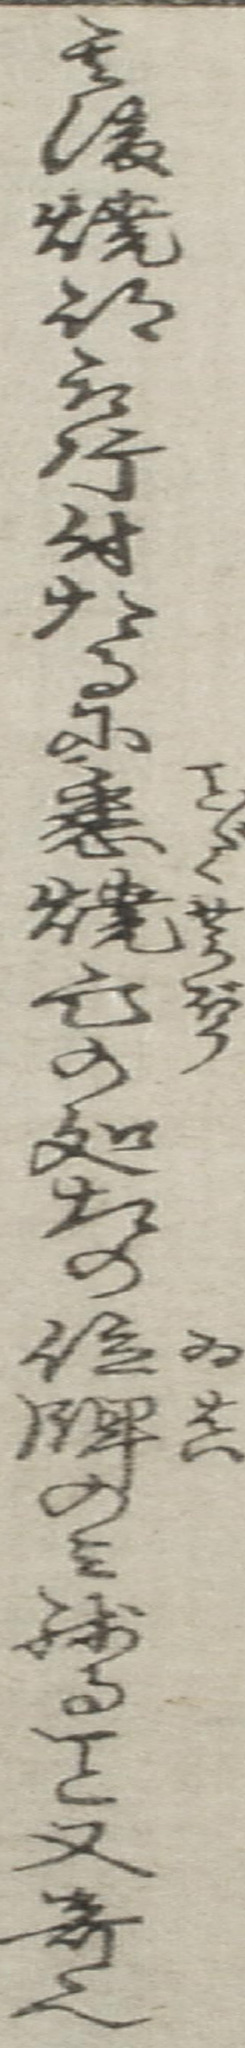其後焼跡取片付たるに悉焼亡の処左の位牌のみ残ること又奇也
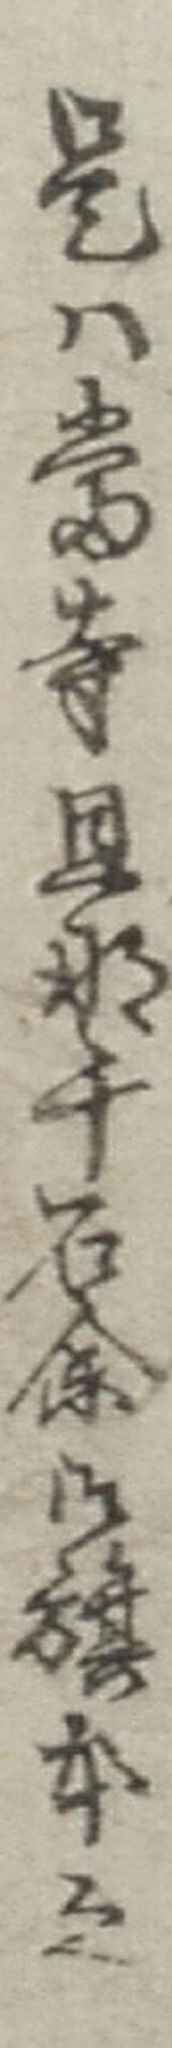是は当寺旦那千石余御旗本也
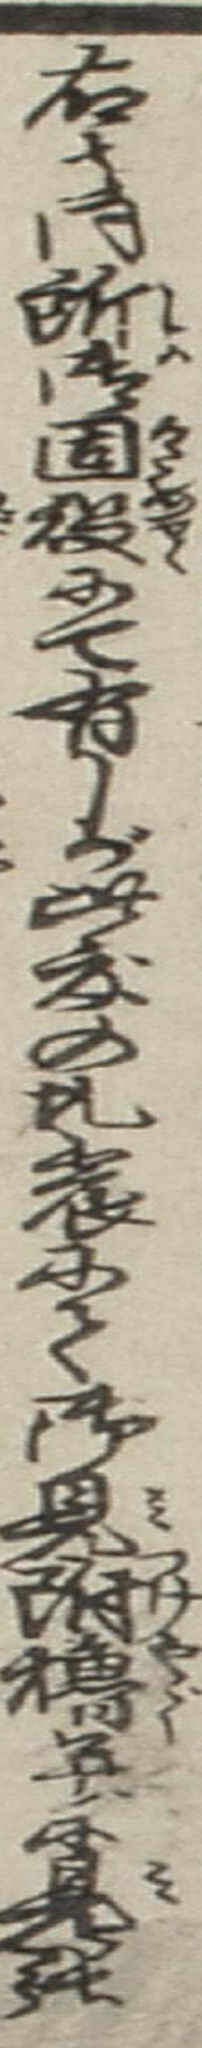右は同所御固役にて有しが此度の地震にて御見附櫓幷に見張
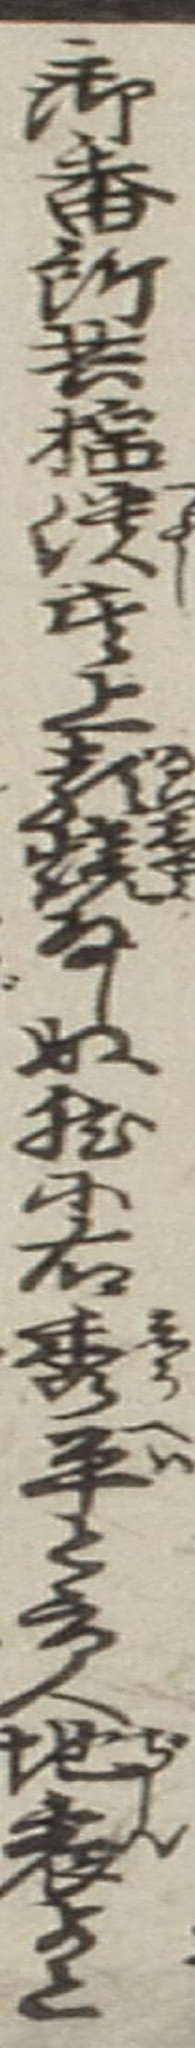御番所共揺潰其上類焼なしぬ然に右秀平と云人地震よと
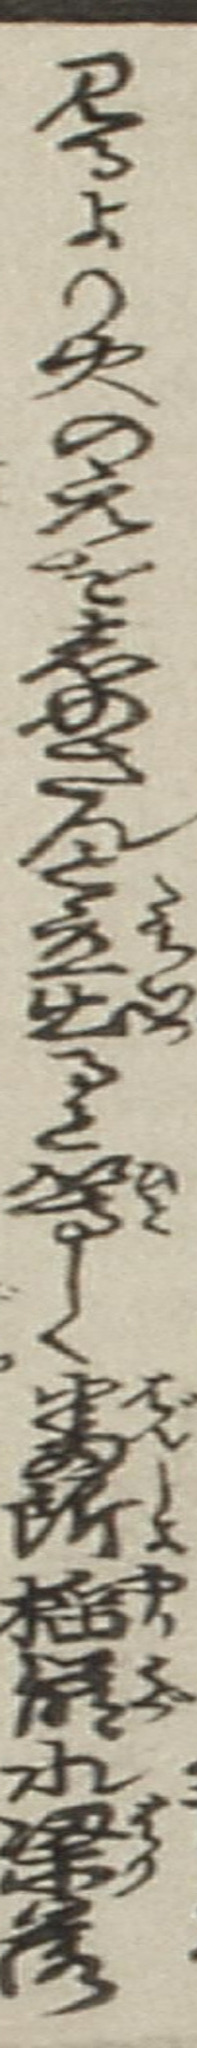見るより火の元をしめさんと立出ると等しく番所揺崩れ梁落
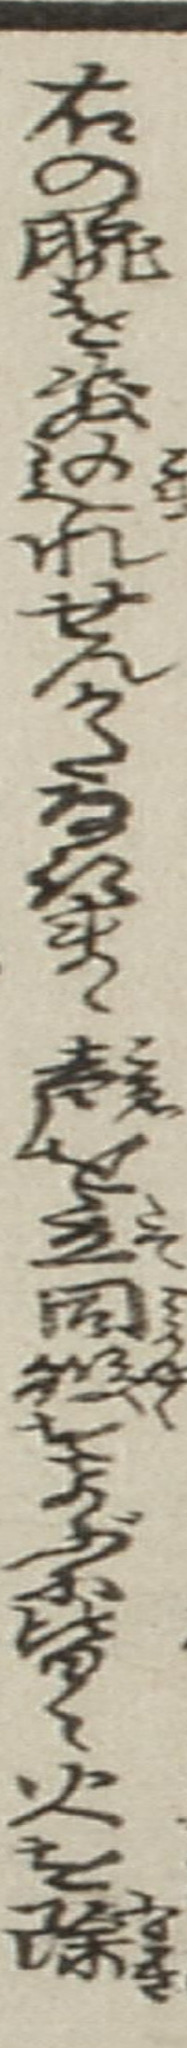右の腕を敷込れせんかたなきまゝ声を立同役をよぶに皆々火を除
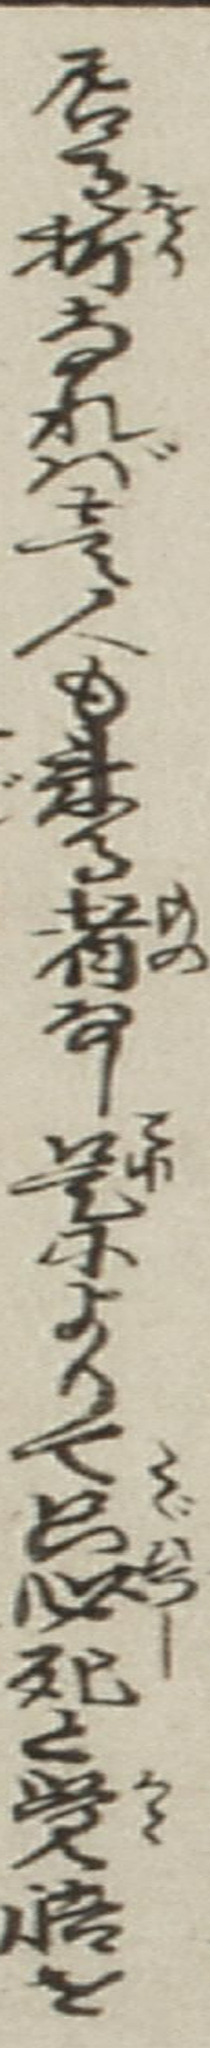居る折なれば壱人も来る者なし是によりて只必死と覚悟を
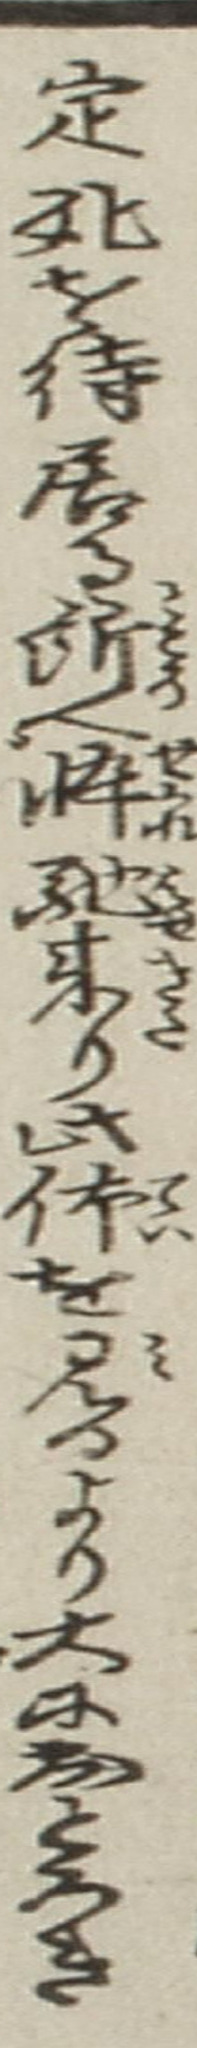定死を待居る所へ忰馳来り此体を見るより大におとろき
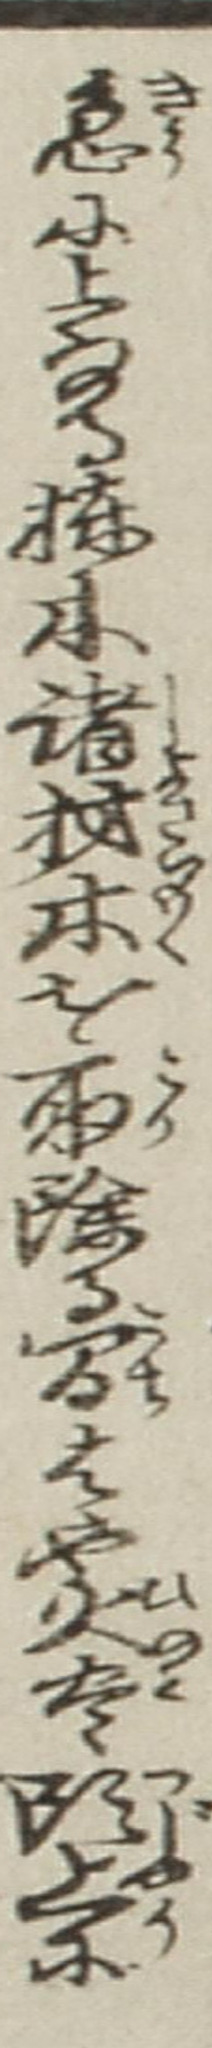急に上なる棟木緒材木を取除る間はや火炎頭上に
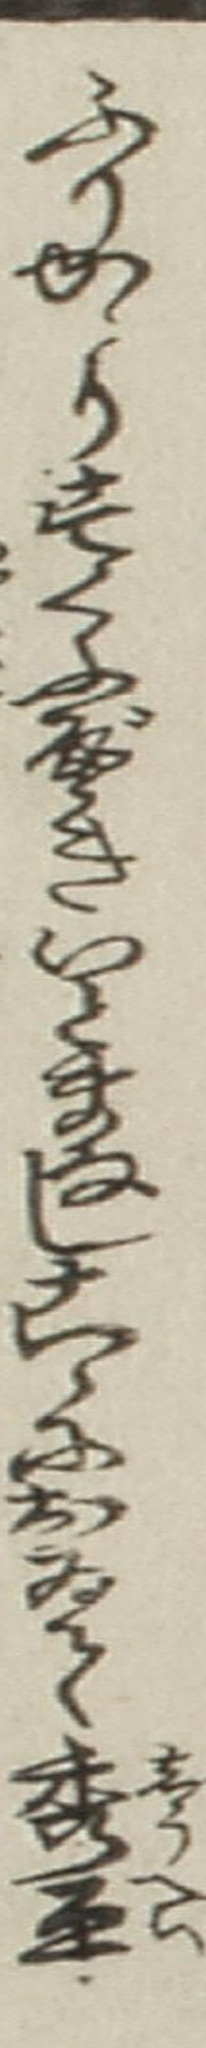ふりかゝりすくふべきいとまなしこゝにおいて秀平
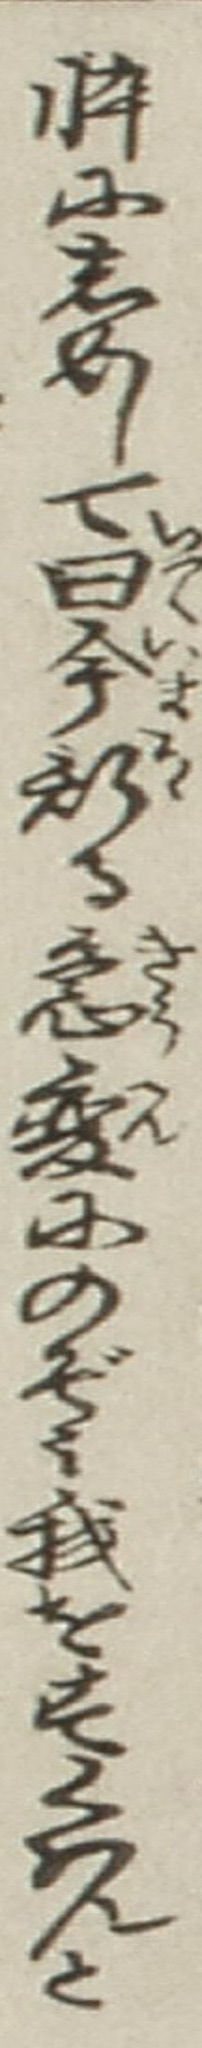忰にしめして曰今斯る急変にのぞみ我をすくはんと
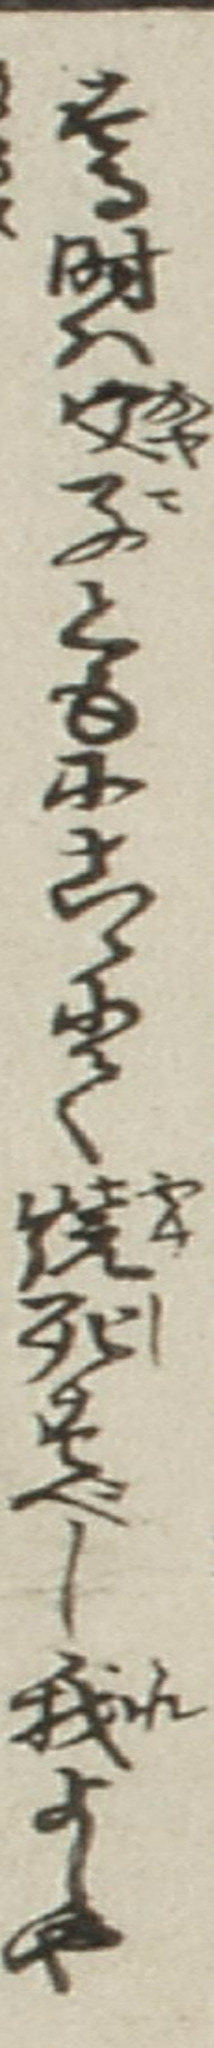する時は父子ともにこゝにて焼死すべし我よしや
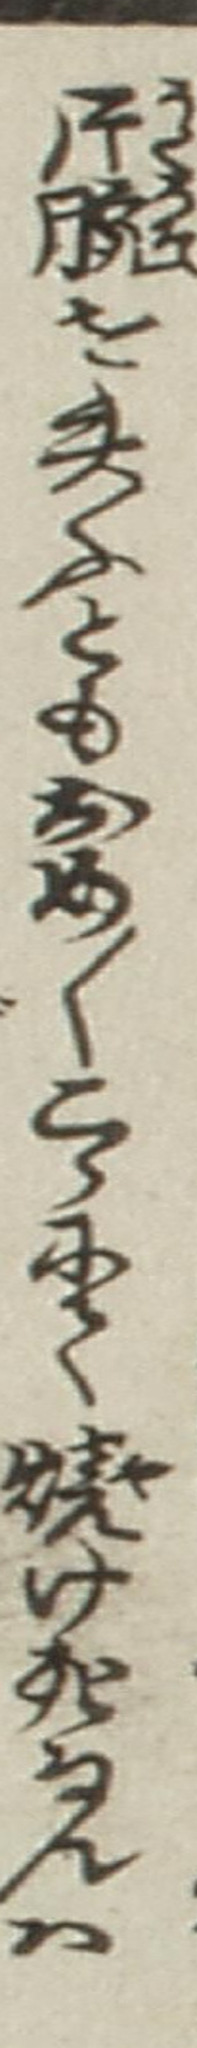片腕を失ふともおめ〳〵こゝにて焼け死なんは
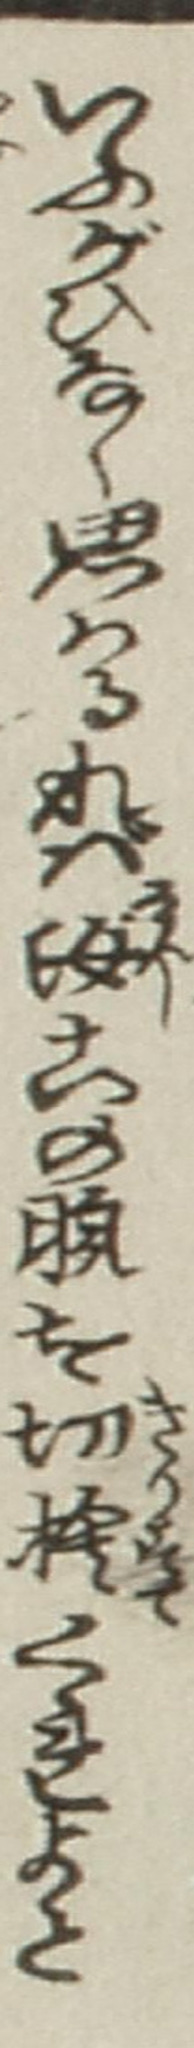いふがひなく思はるれば汝この腕を切捨くれよと
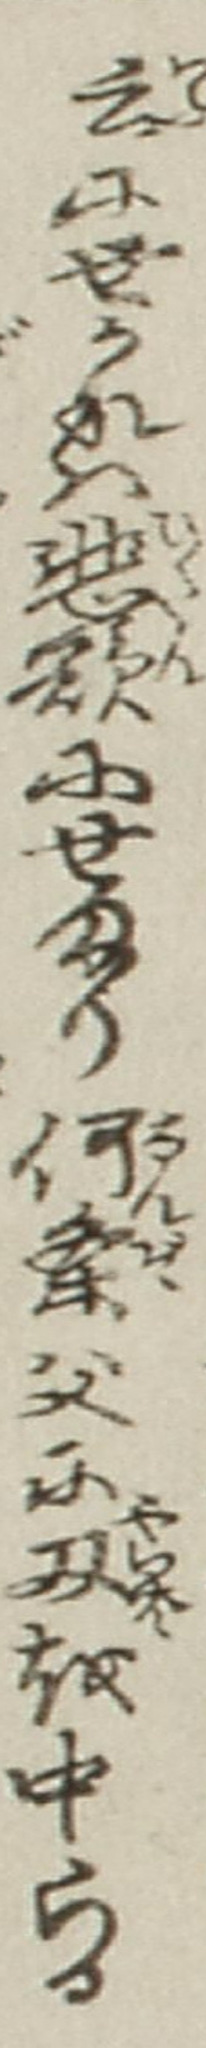云にせかれは悲歎にせまり何条父に刃を中らる
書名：安政見聞誌　下
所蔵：東京大学地震研究所図書室 Earthquake Research Institute Library, The University of Tokyo, JAPAN
